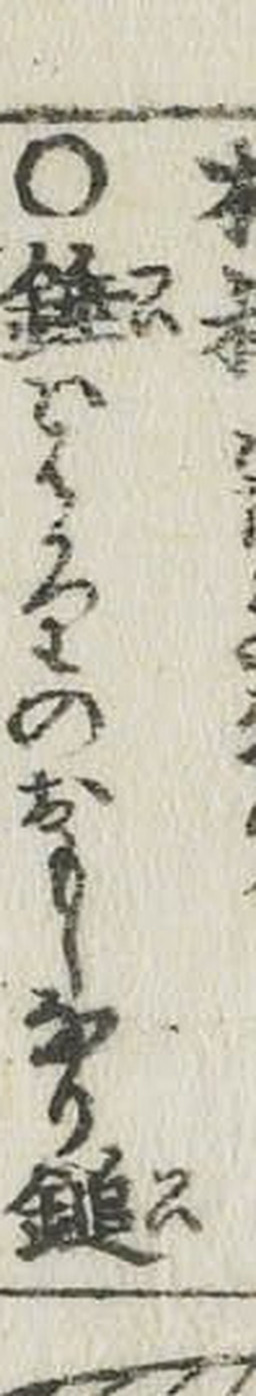○錘ははかりのおもしなり鎚
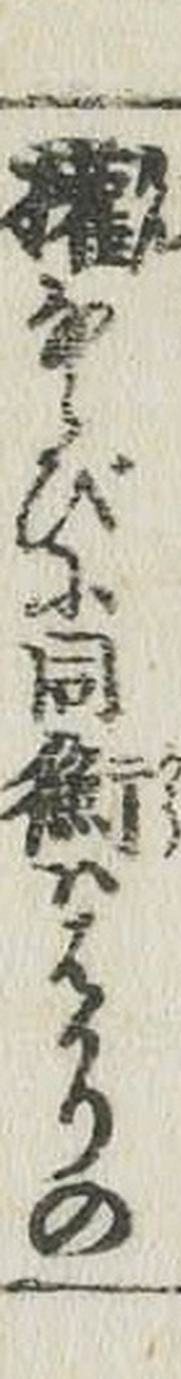権ならびに同衡ははかりの
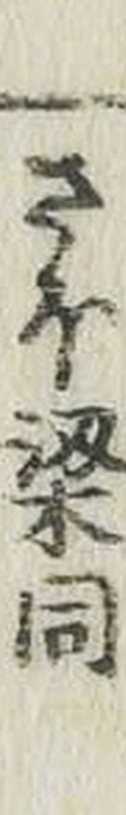さほ梁同
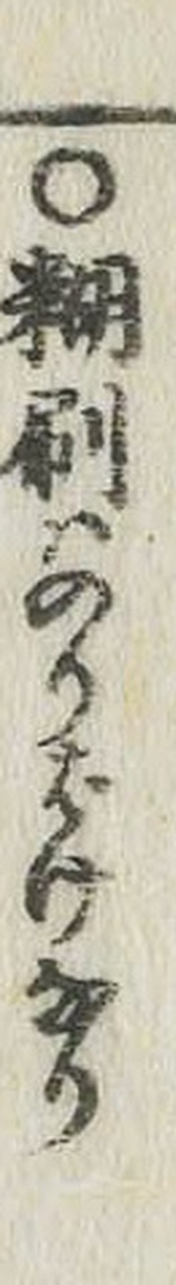○糊刷はのりばけなり
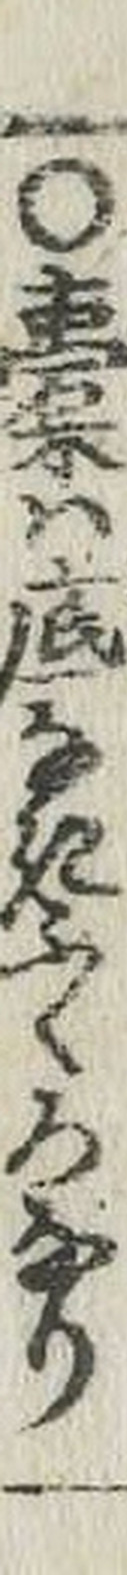○槖は底なきふくろなり

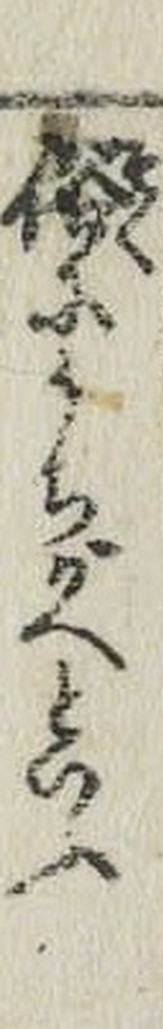俗にうちがへといふ
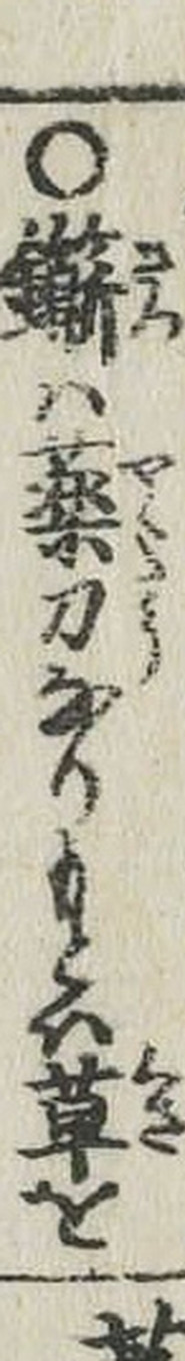○𨰉は薬刀なりもとは草を
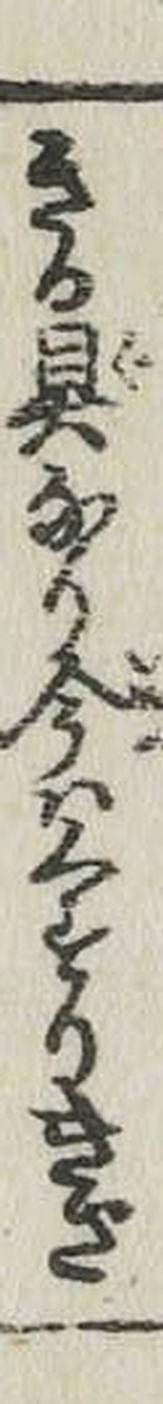きる具なり今はくすりきざ
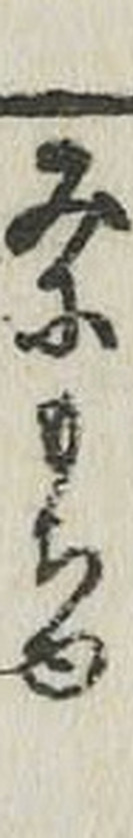みにもちゆ
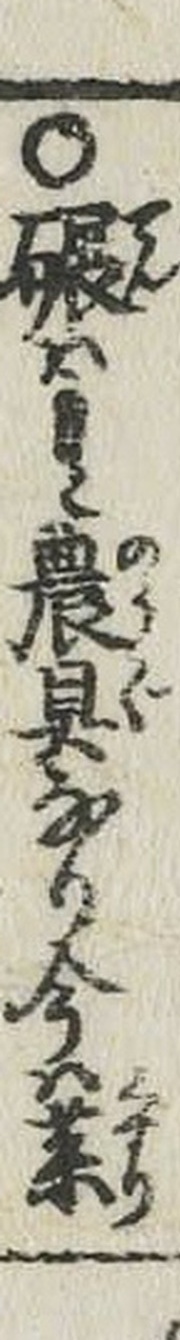○碾はもと農具なり今は薬
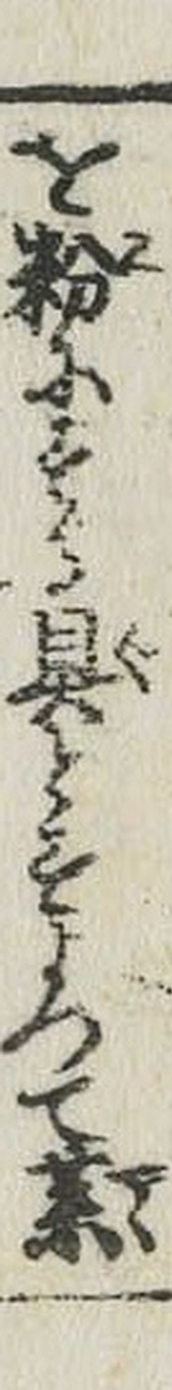を粉にする具とすよつて薬
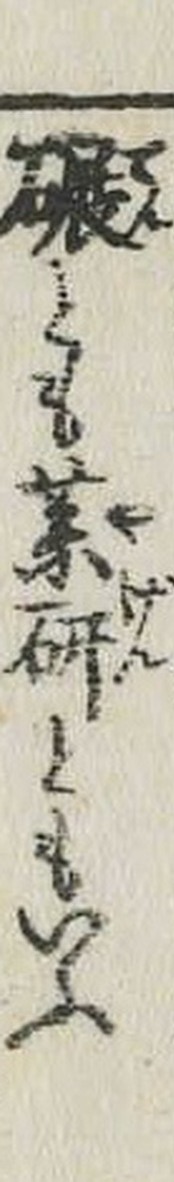碾とも薬研ともいふ
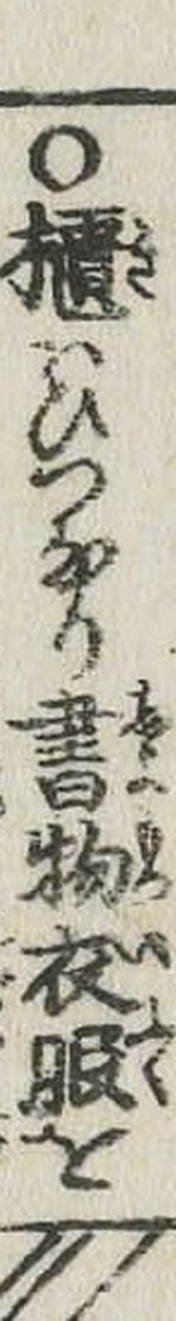○櫃はひつなり書物衣服を
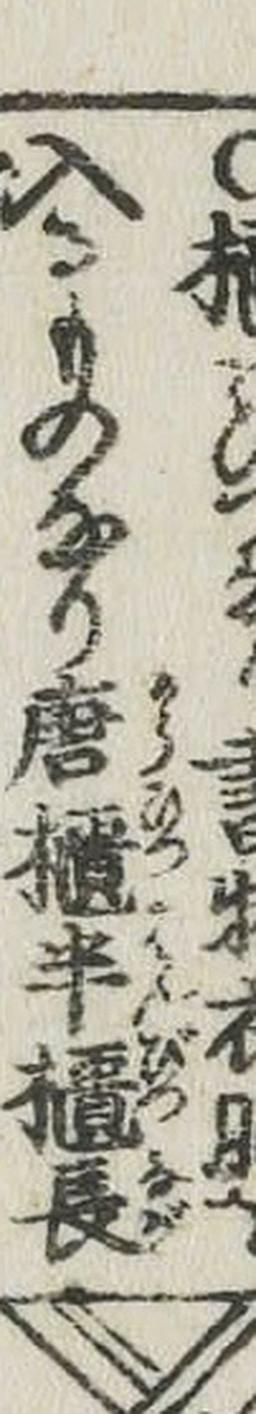入るものなり唐櫃半櫃長
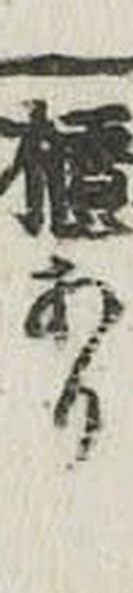櫃あり
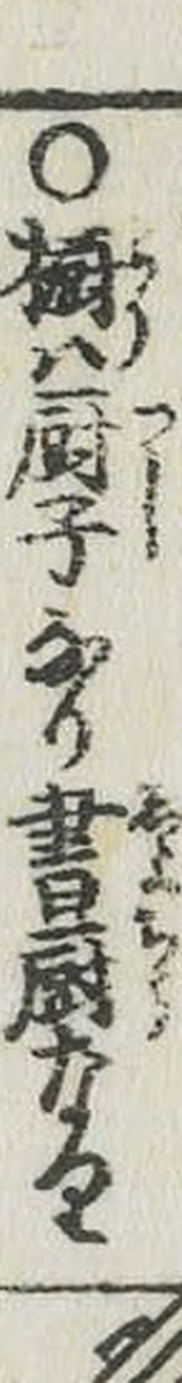○橱は厨子なり書厨なり
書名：増補頭書訓蒙図彙大成 10巻 5:巻之9-11
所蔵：東京学芸大学教育コンテンツアーカイブ
